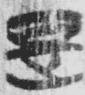是
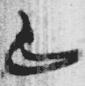㠯（以）
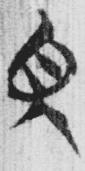視
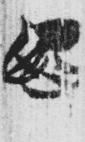臤（賢）
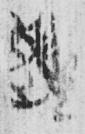○（履）
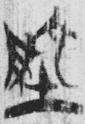○（地）
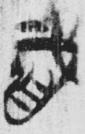○（戴）
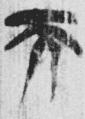天
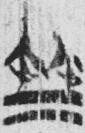竺（篤）
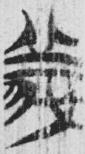義
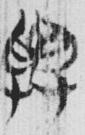與
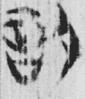○（信）
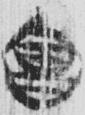會
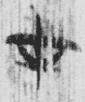才（在）
